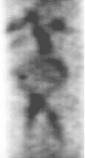貧（紛）
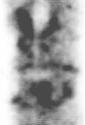齒
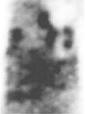銿
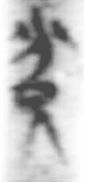貧（紛）
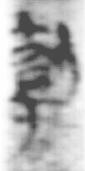韌
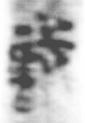戠（黓）
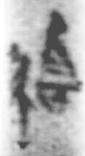○（組）
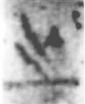之
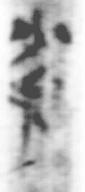貧（紛）
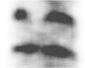二
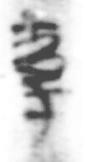韋
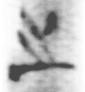之
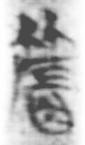○（席）
